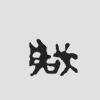戕
